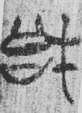○（凡）
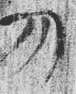勿（物）
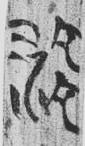流
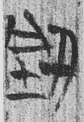型（形）
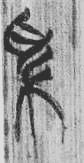○（奚）
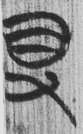○（得）
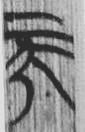而
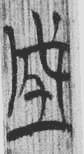城（成）
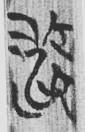流
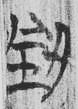型（形）
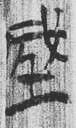城（成）
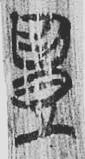豊（體）
